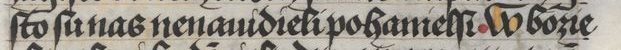ſto ſu nas nenauidieli pohanielſi.W bozie
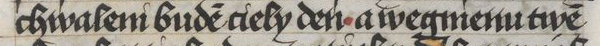chwaleni budē ciely den.a wegmenu twē
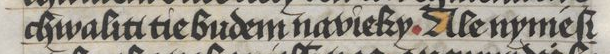chwaliti tie budem navieky.Ale nyníe ſi
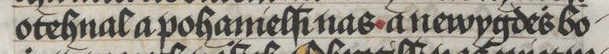otehnal a pohaníelſi nas.a newygdeṡ bo¬
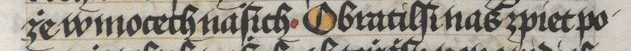że w mocech naẛich.Obratilſi nas zpiet po¬
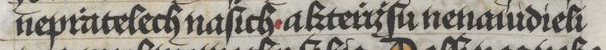nepřatelech naẛich.a kteřiž ſu nenauidieli
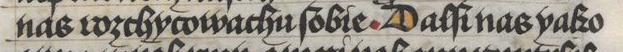nas rozchycowachu ſobie.Dalſi nas yako
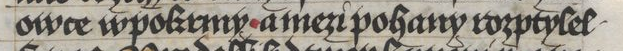owce wpokrmy.a mezi pohany rozptylel¬
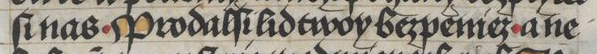ſi nas.Prodalſi lid twoy bezpeníez.a ne¬
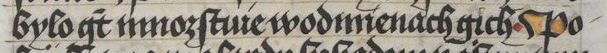bylo ḡt mnozſtuíe wodmíenach gich.Po¬
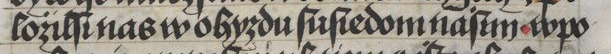lożilſi nas w ohyzdu ſuſiedom naẛim.w po¬
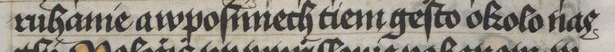ruhaníe a w poſmíech tiem geẛto okolo nas
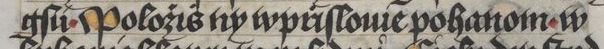gſú.Polożíṡ ny wpṙiſlouie pohanom.w
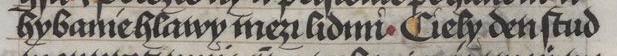hybaníe hlawy mezi lidmi.Ciely den ſtud
